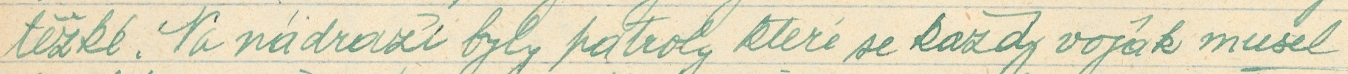těžké. Na nádraží byly patroly které se každy voják musel
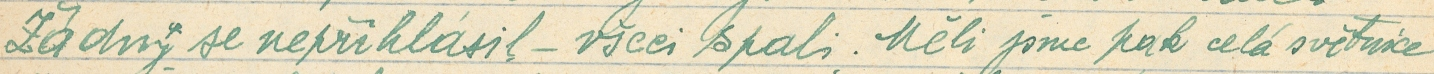Žádný se nepřihlásil - všeci spali. Měli jsme pak celá světnice
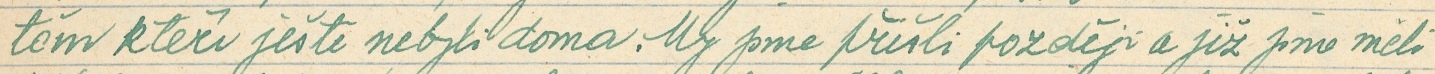těm kteří ještě nebyli doma. My jsme přišli později a již jsme měli
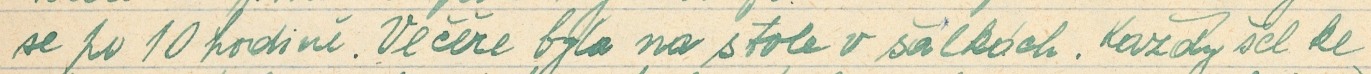se po 10 hodině. Večeře byla na stole v šálkách. Každý šel ke
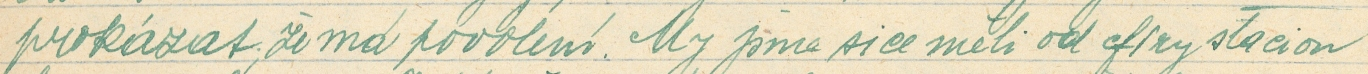prokázat,že má povolení. My jsme sice měli od fíry stacion
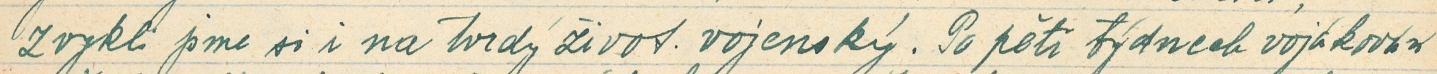zvykli jsme si i na tvrdý život. vojenský. Po pěti týdnech vojákování
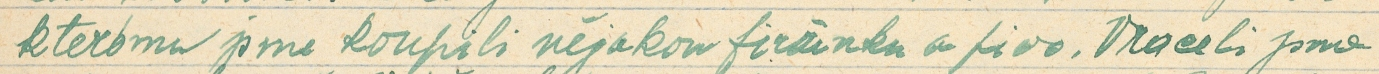kterému jsme koupili nějakou firžinku a pivo. Vraceli jsme
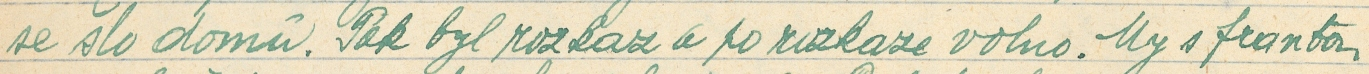se šlo domů. Pak byl rozkaz a po rozkaze volno. My s frantou
